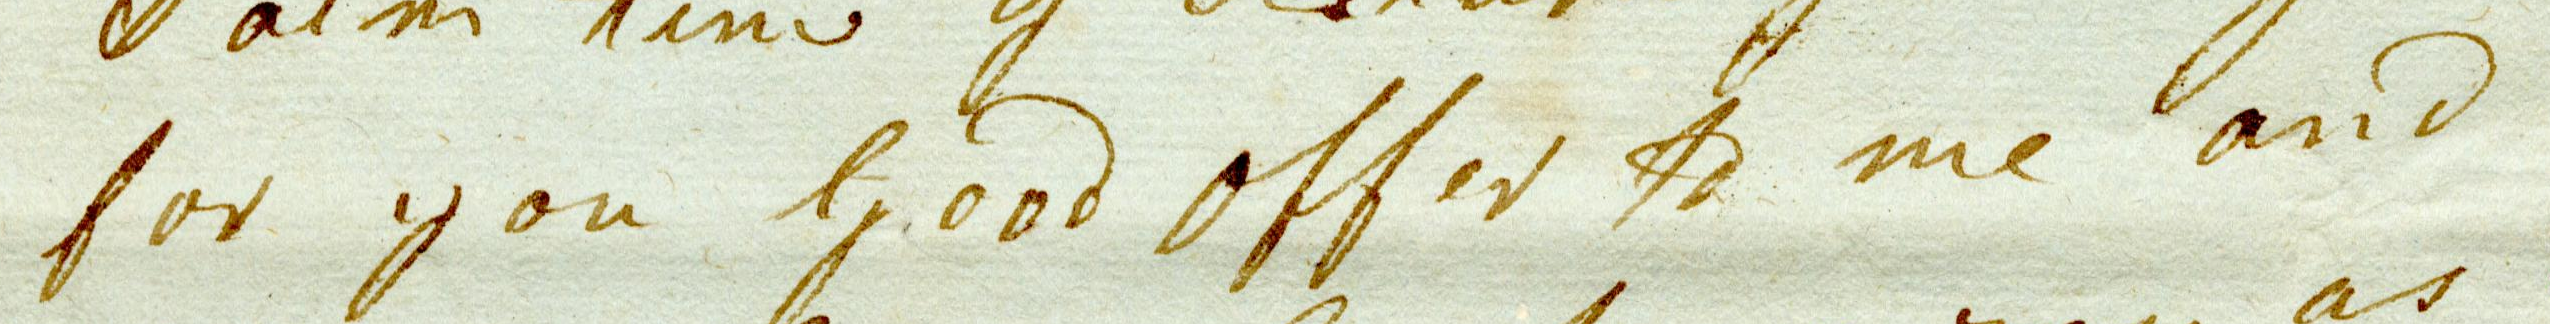for you Good offer to me and
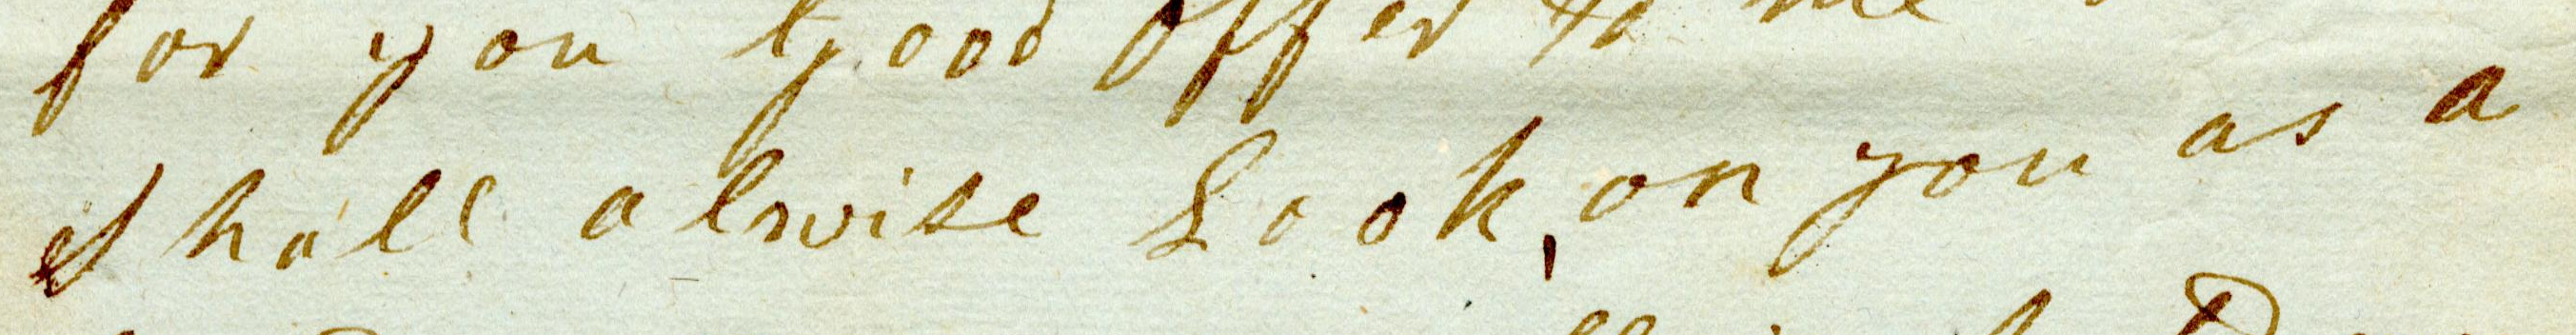shall alwise look on you as a
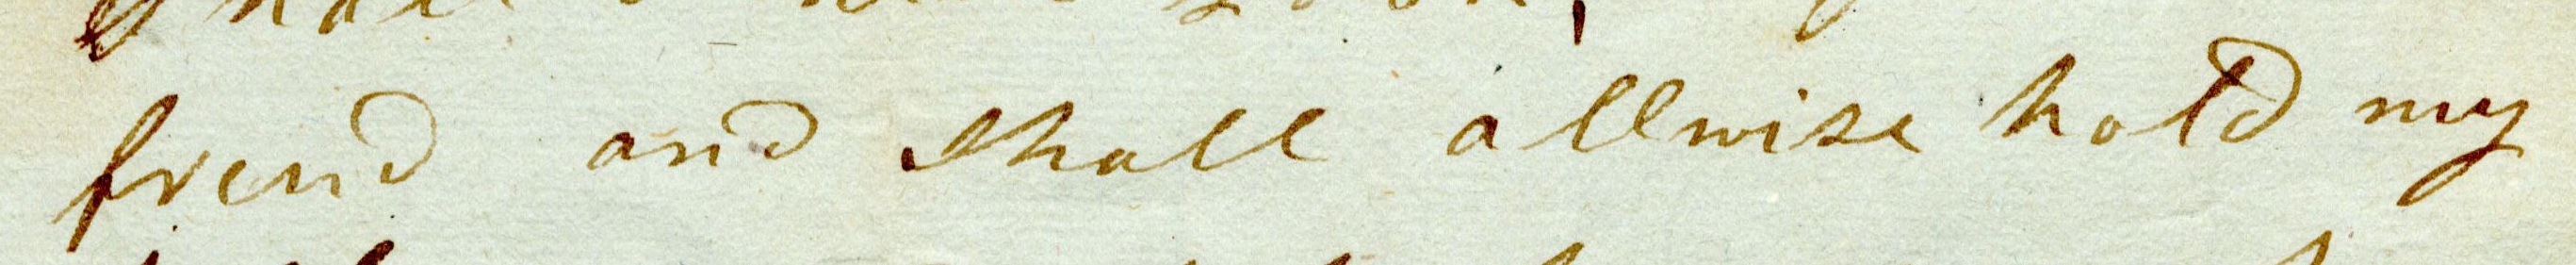frend and shall allwise hold my
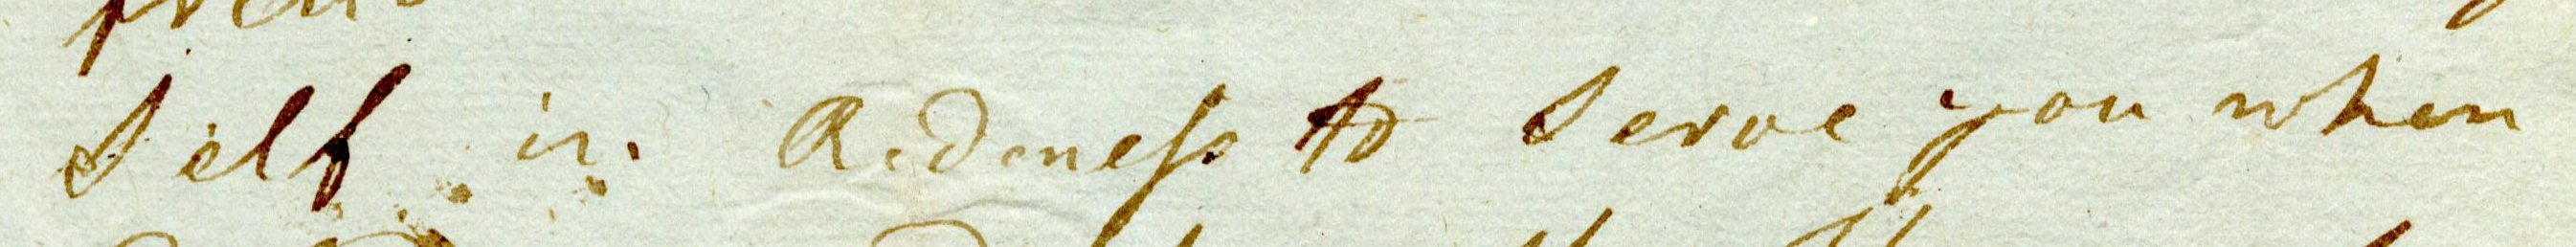Self in Rediness to serve you when
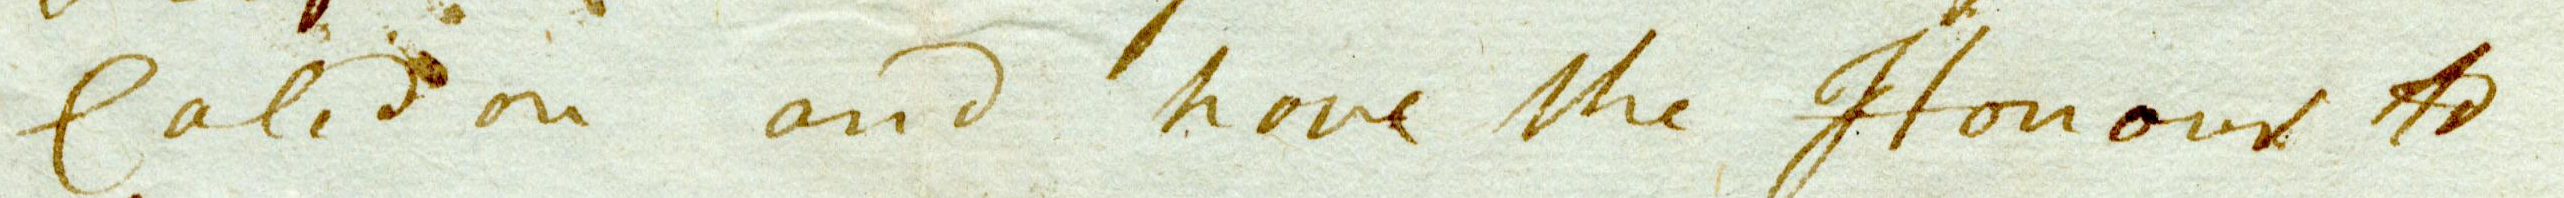Caled on and have the Honour to
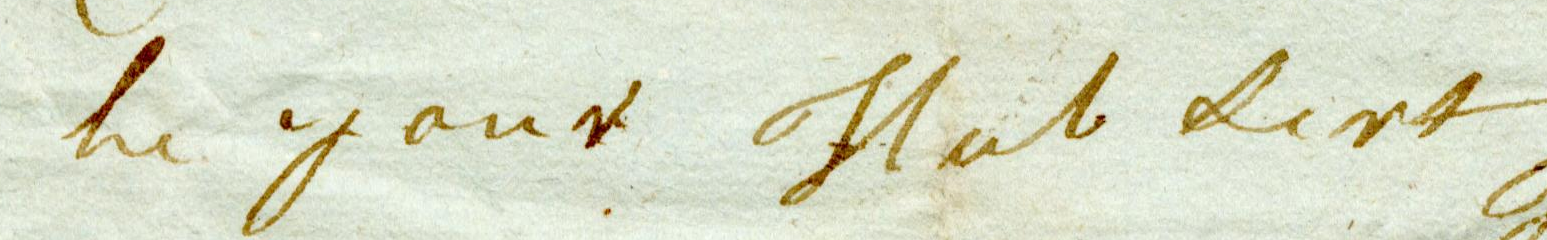be your Hub sert
